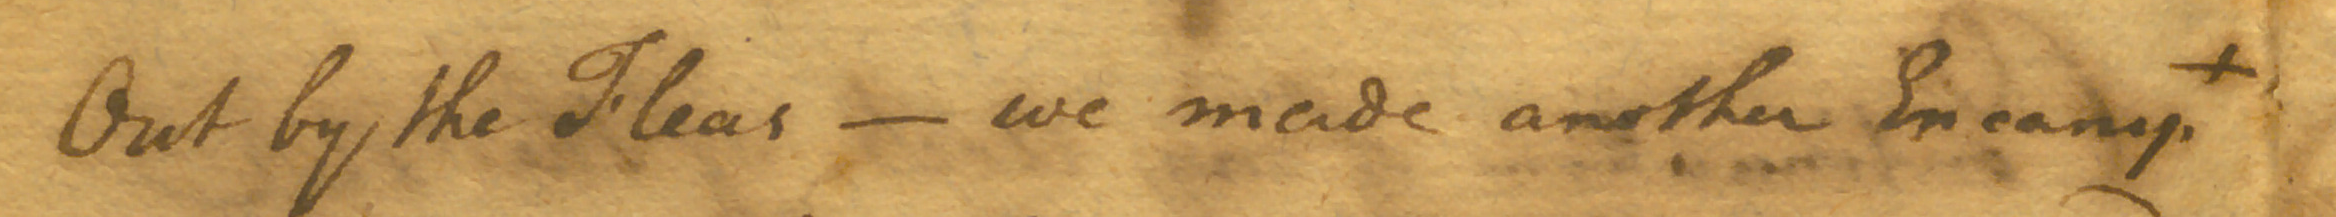Out by the Fleas- we made another Encamp^t
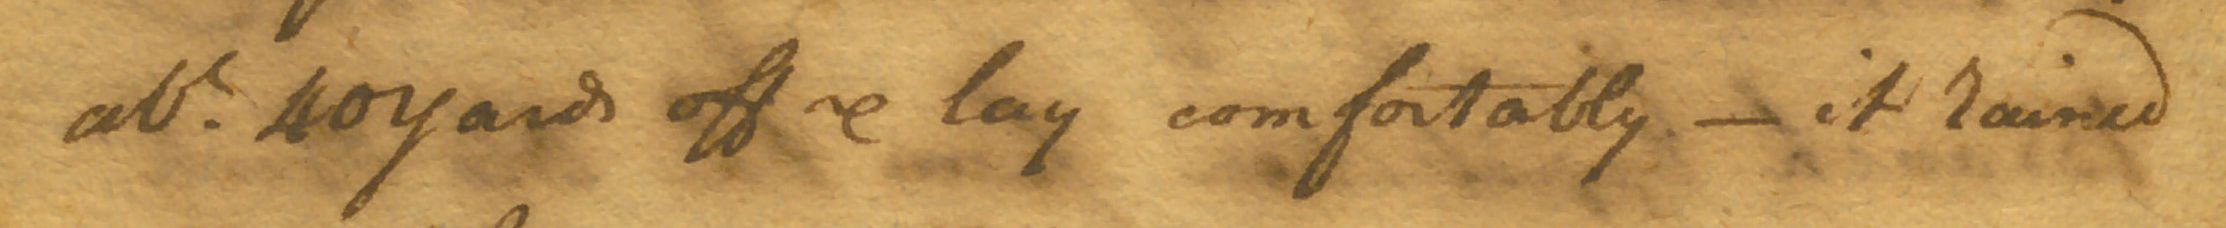ab^t. 40 yard off & lay comfortably- it rained
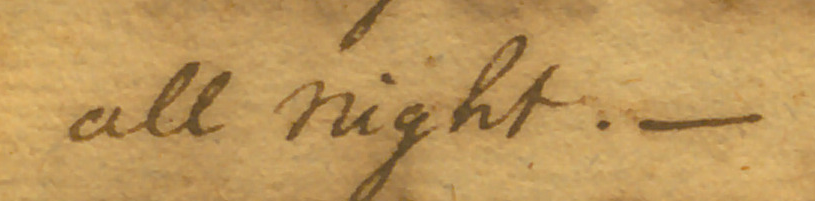all night.-
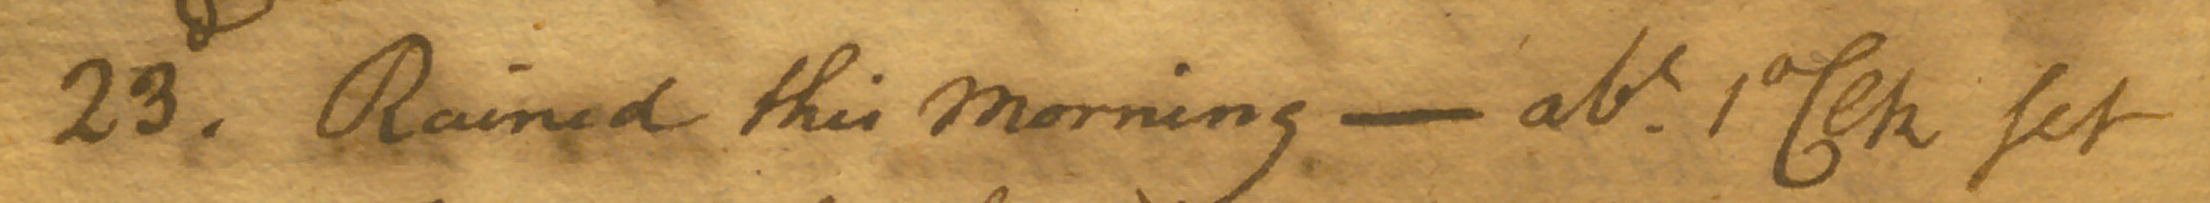23^d. Rained this morning- ab^t. 1 ^oClk set
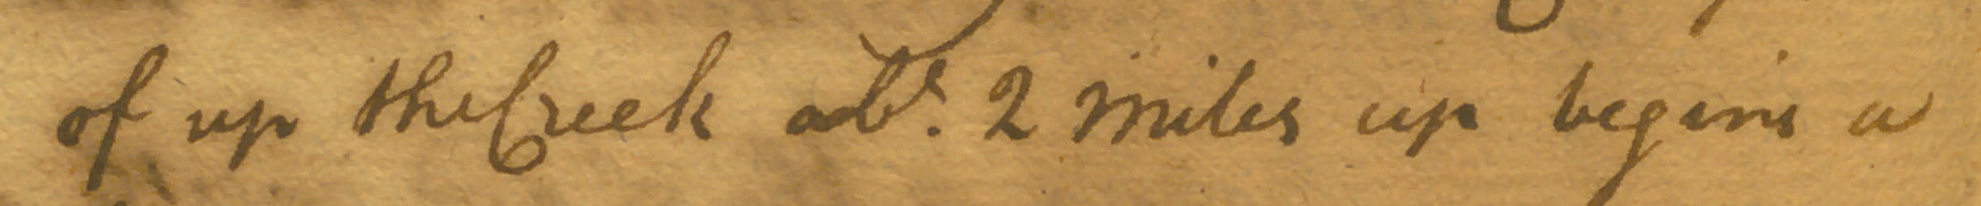of up the Creek ab^t. 2 miles up begins a
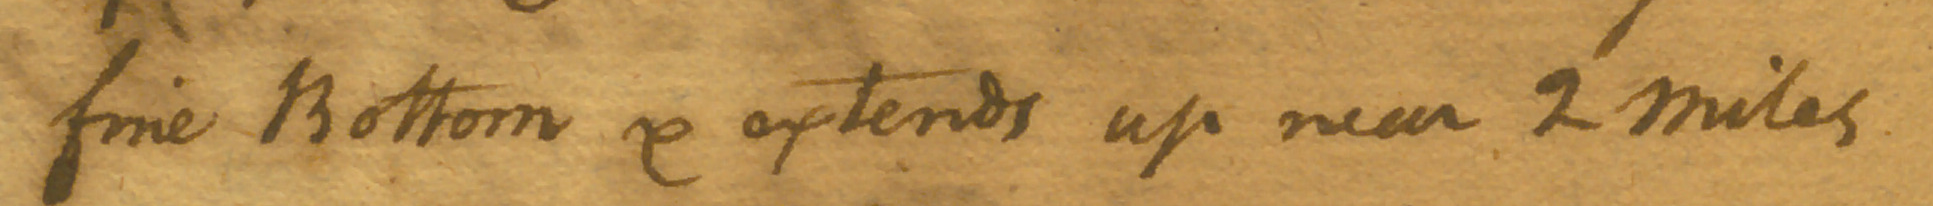fine Bottom & extends up near 2 miles
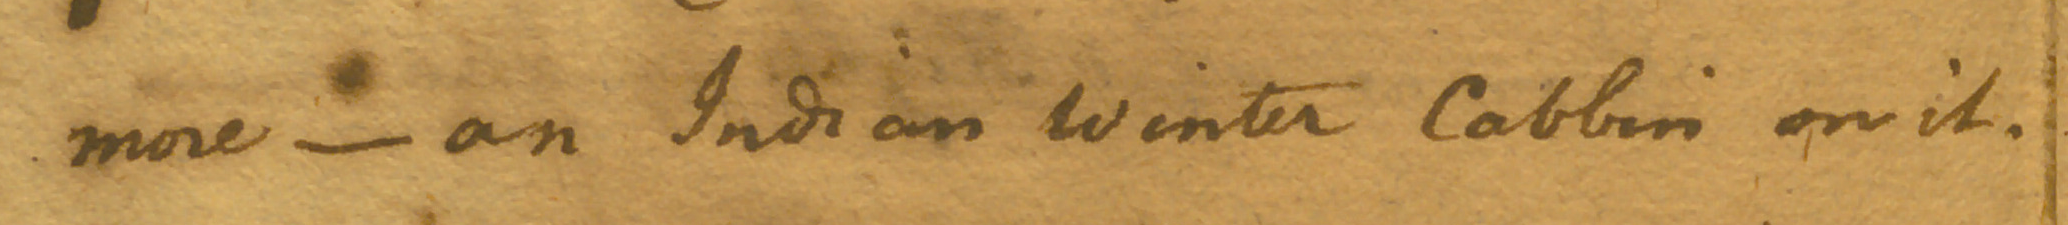more- an Indian winter cabbin on it
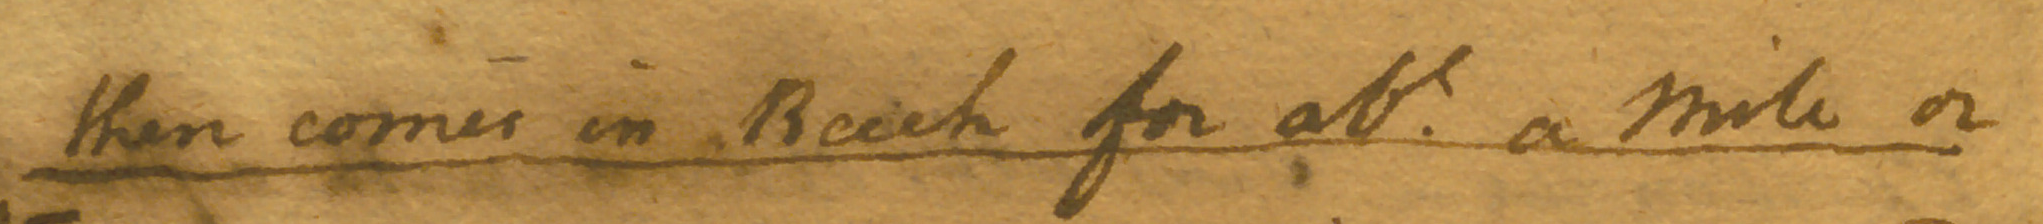then comes in Beech for ab^t. a mile or
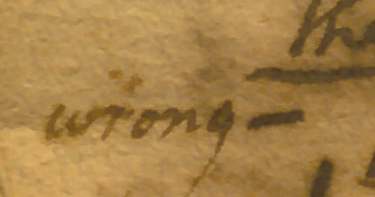wrong-
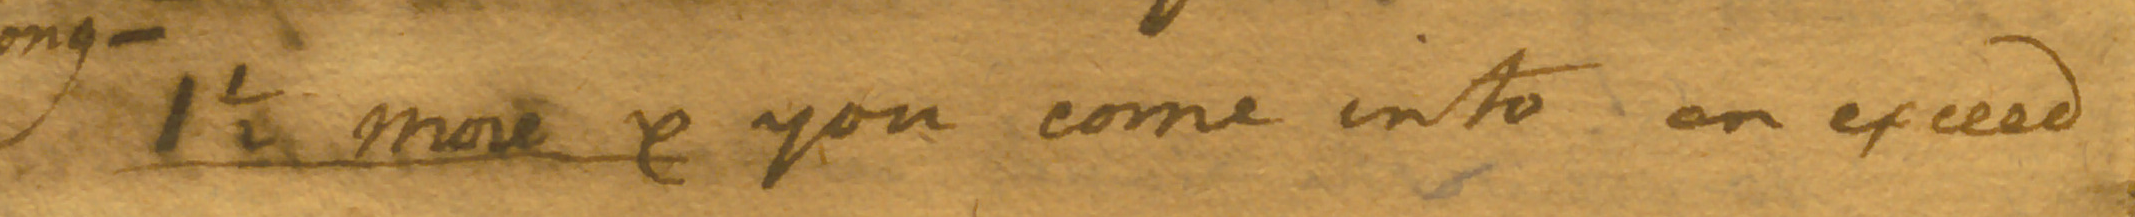1 1/2 more & you come into an exceed
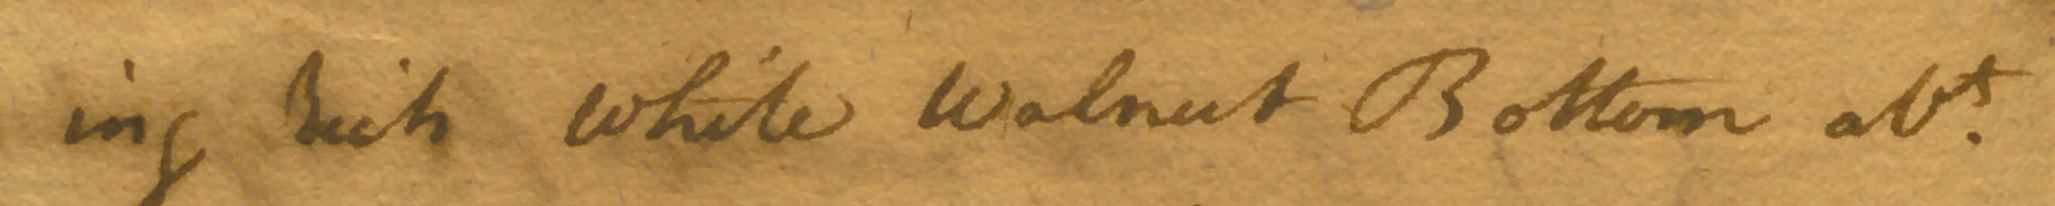ing Beech white walnut Bottom ab^t.
